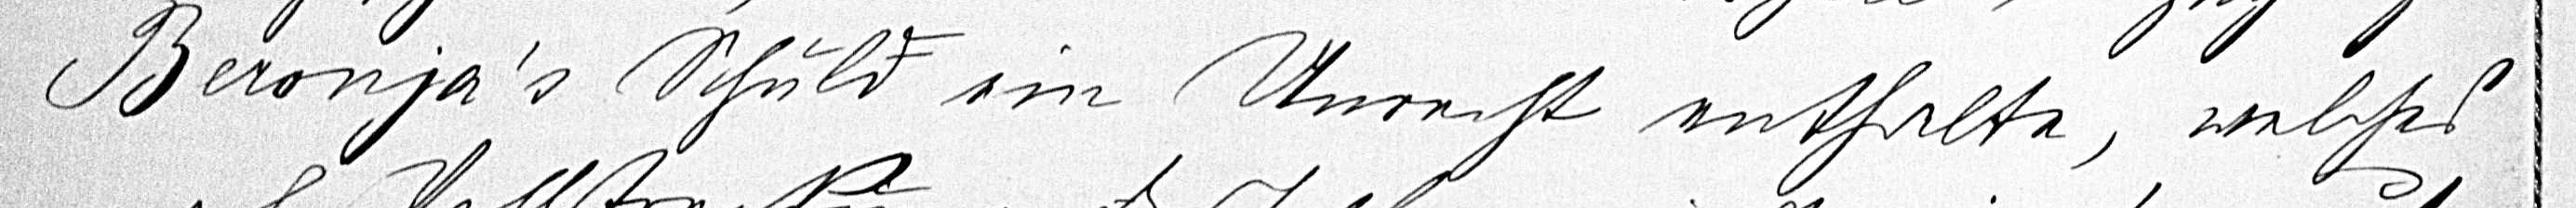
Beronja's Schuld ein Unrecht enthalte, welches
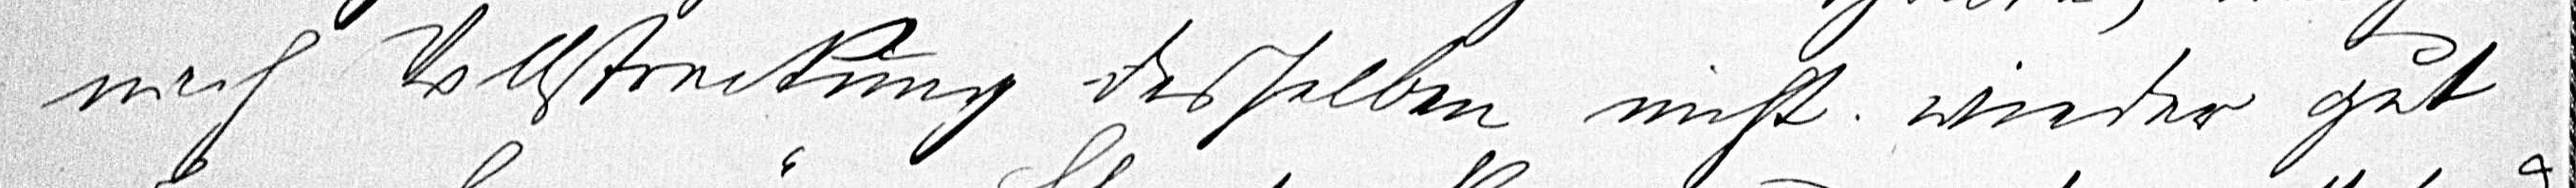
nach Vollstreckung desselben nicht wieder gut
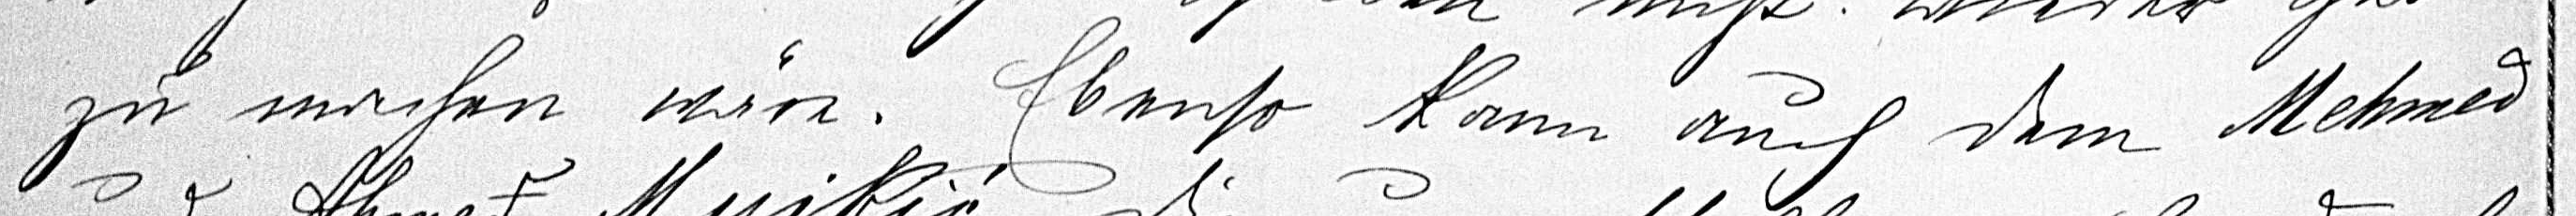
zu machen wäre. Ebenso kann auch dem Mehmed
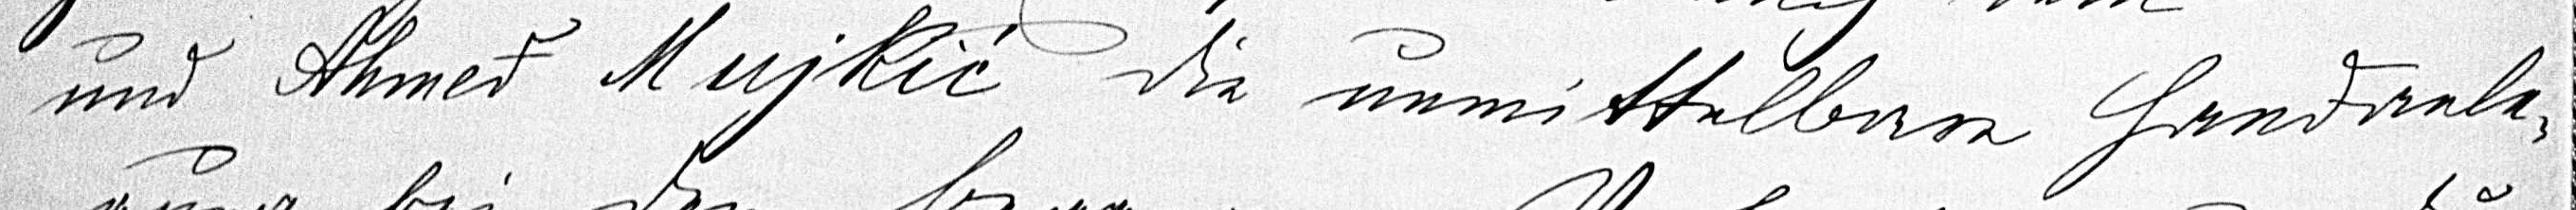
und Ahmed Mujkić die unmittelbare Handanle¬
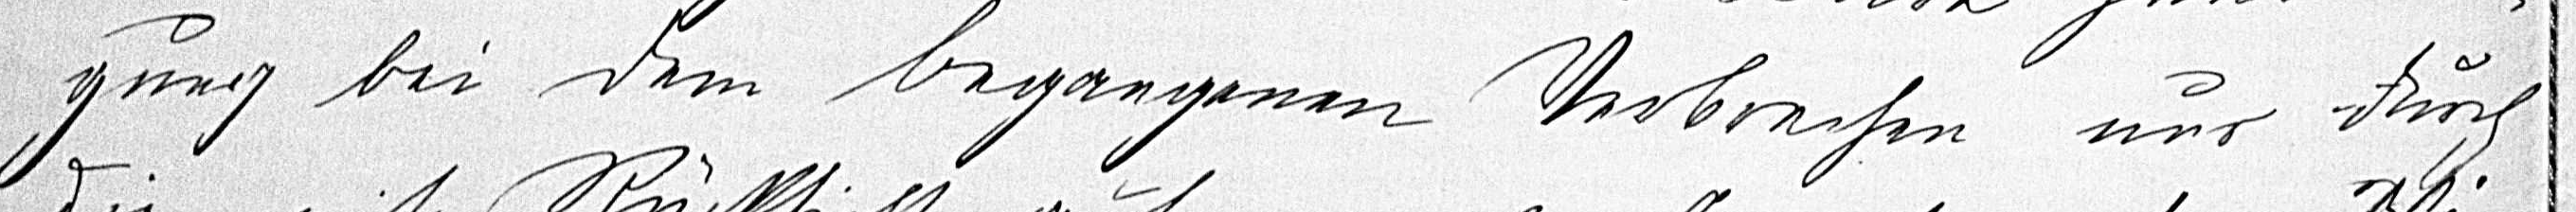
gung bei dem begangenen Verbrechen nur durch
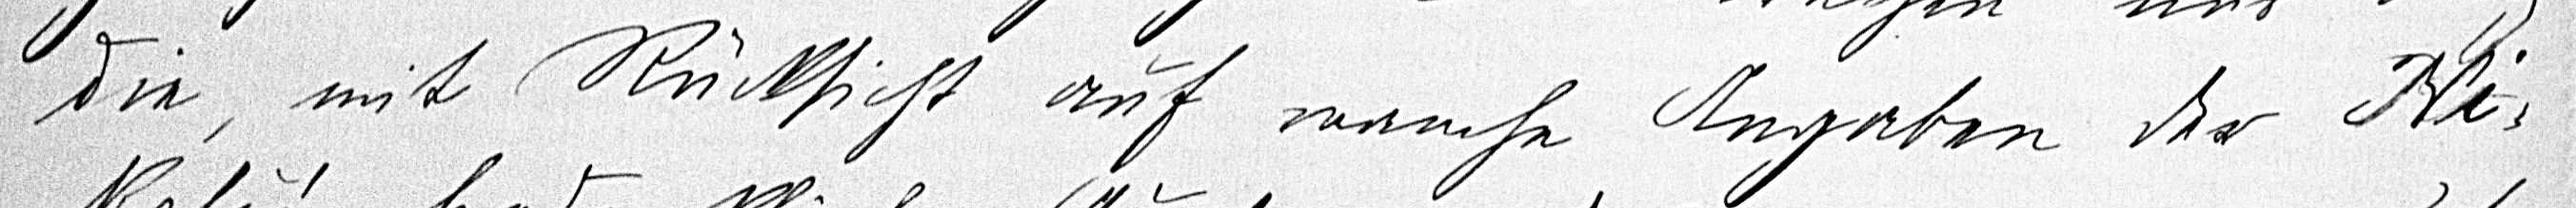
die, mit Rücksicht auf manche Angaben der Ni¬
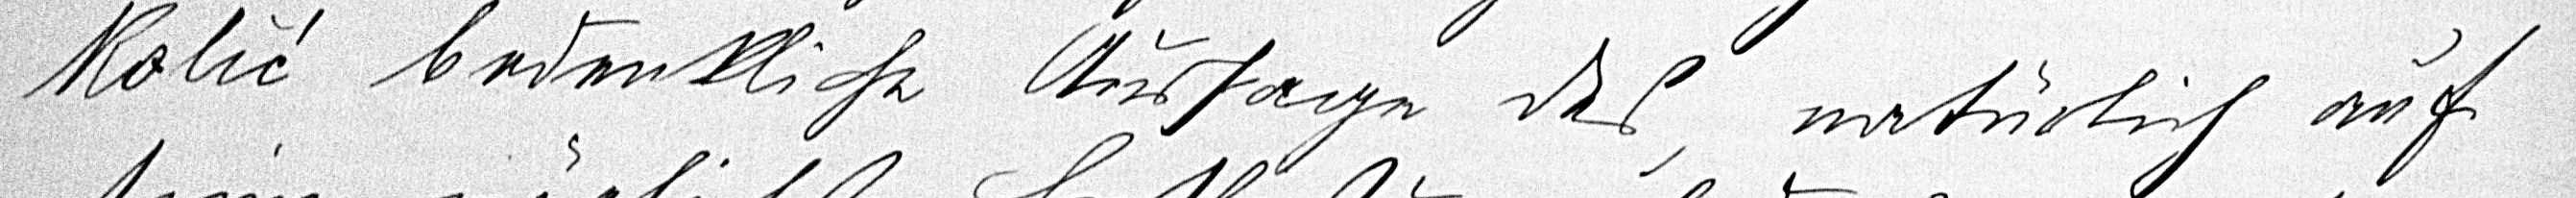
kolić bedenkliche Aussage des, natürlich auf
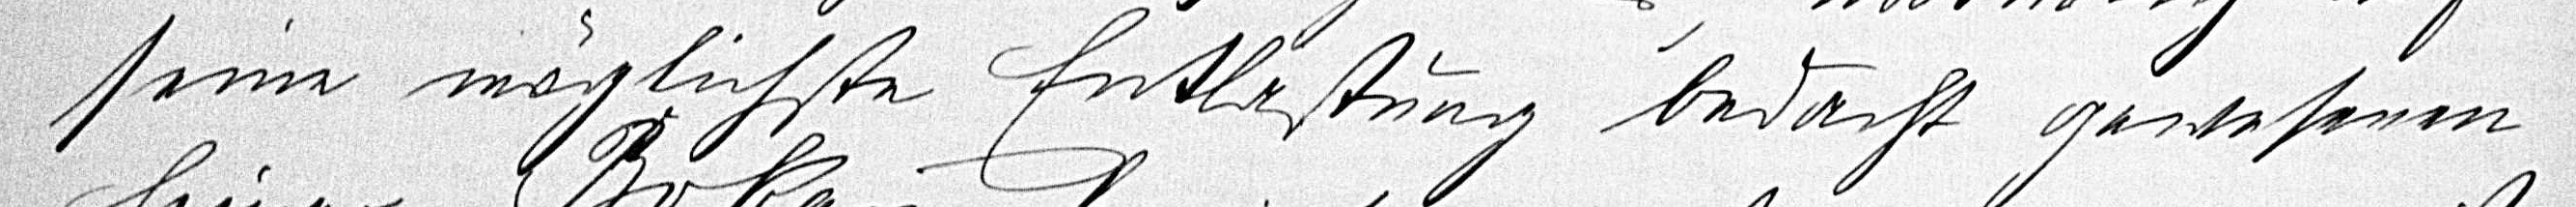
seine möglichste Entlaßung bedacht gewesenen
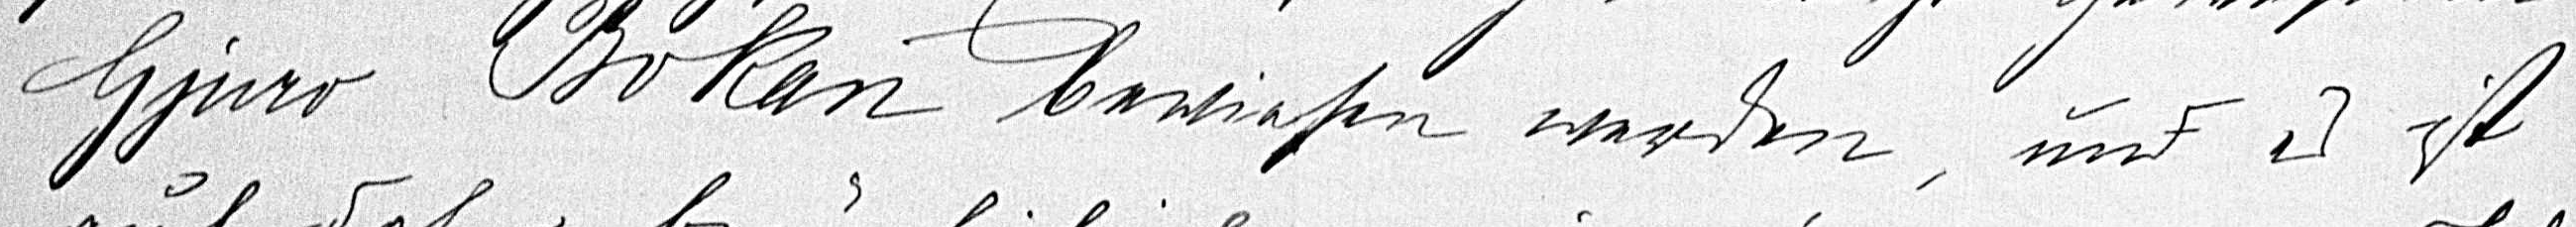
Gjuro Bokan bewiesen werden, und es ist
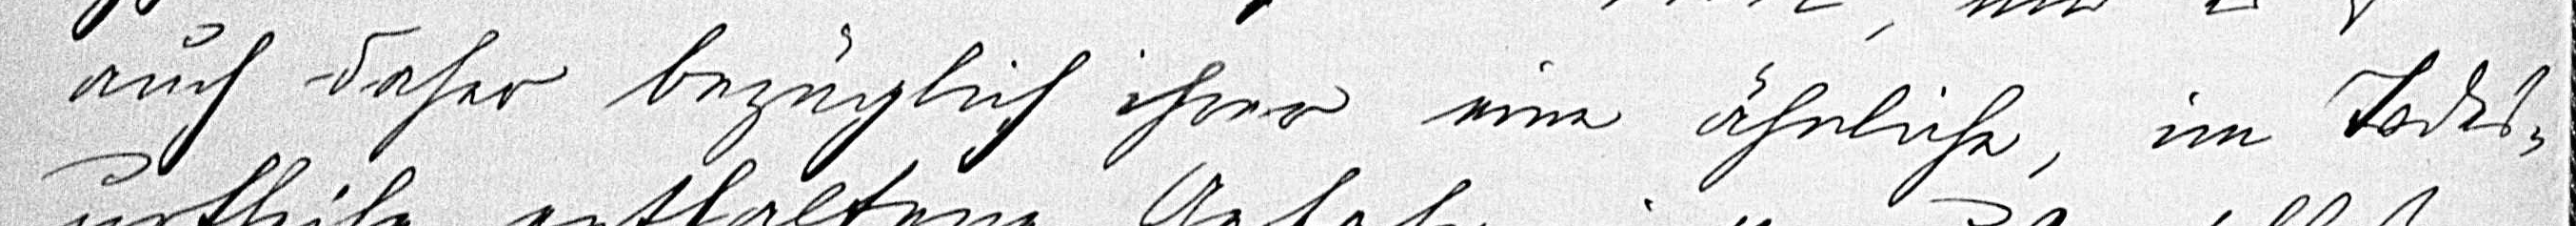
auch daher bezüglich ihrer eine ähnliche, im Todes¬
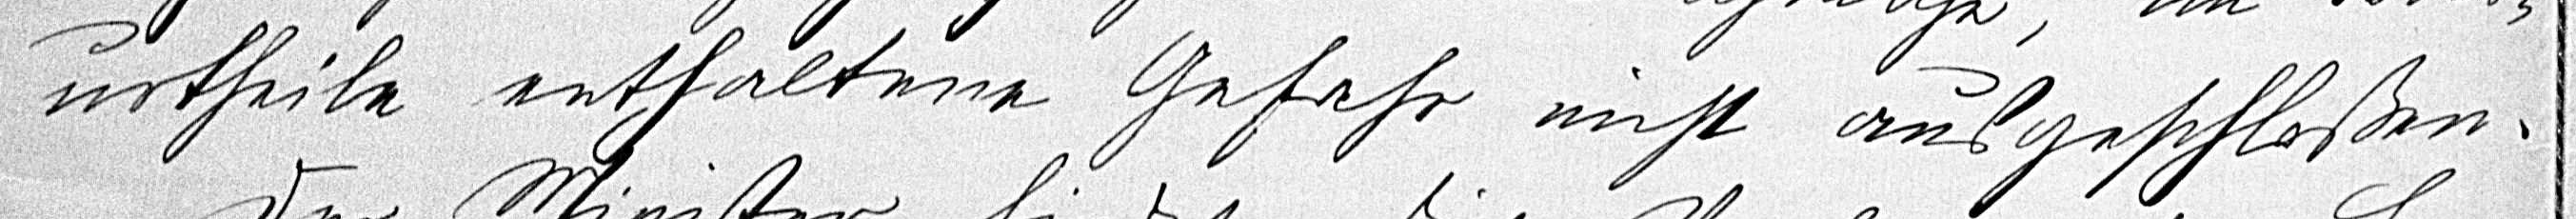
urtheile enthaltene Gefahr nicht ausgeschloßen.
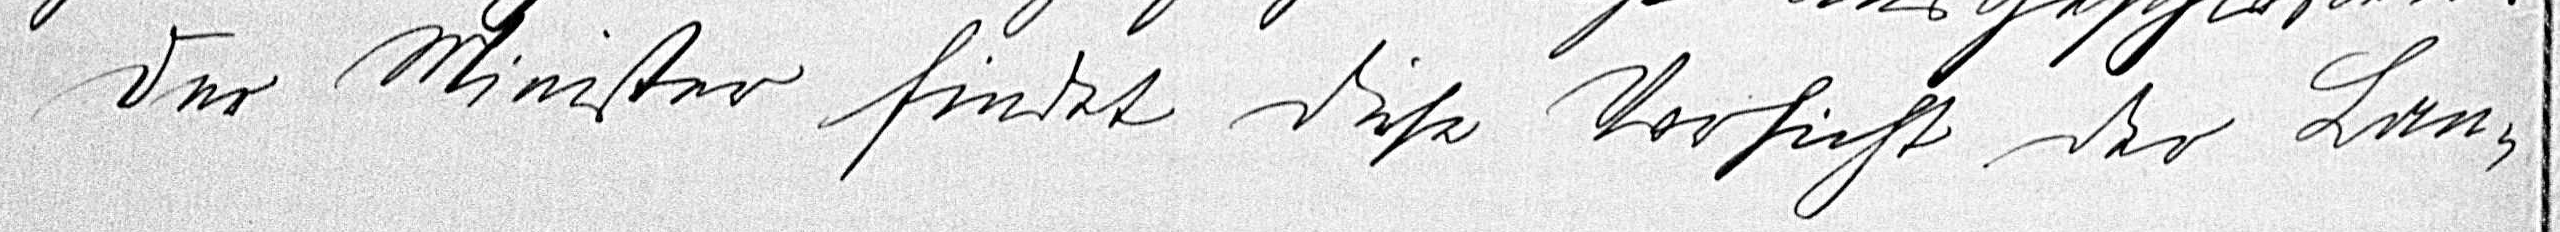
Der Minister findet diese Vorsicht der Lan¬
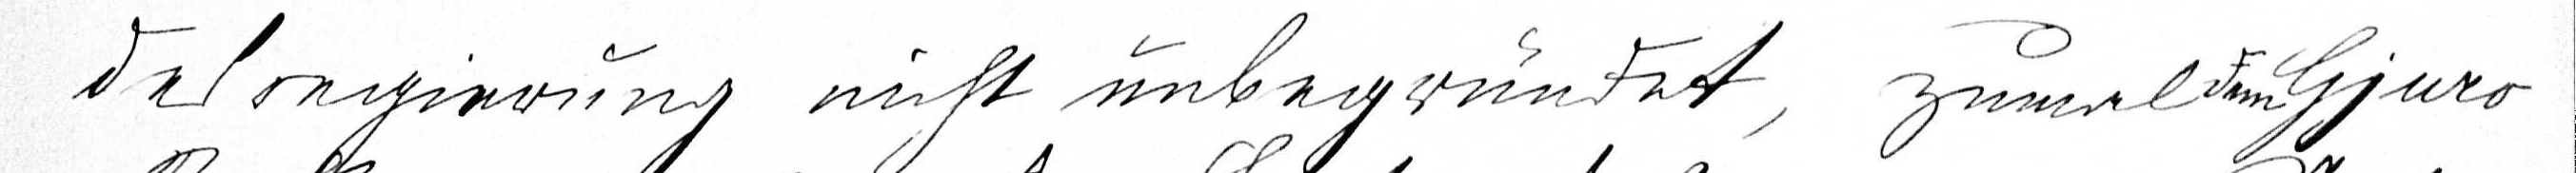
des regierung nicht unbegründet, zumal dem Gjuro
